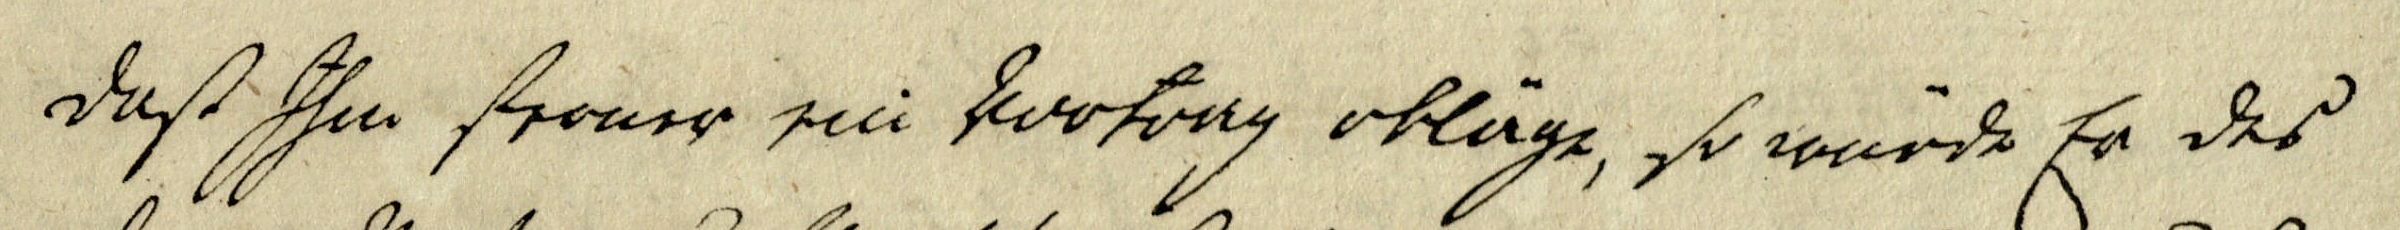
daß Ihm ferner ein Vortrag obläge, so würde Er des
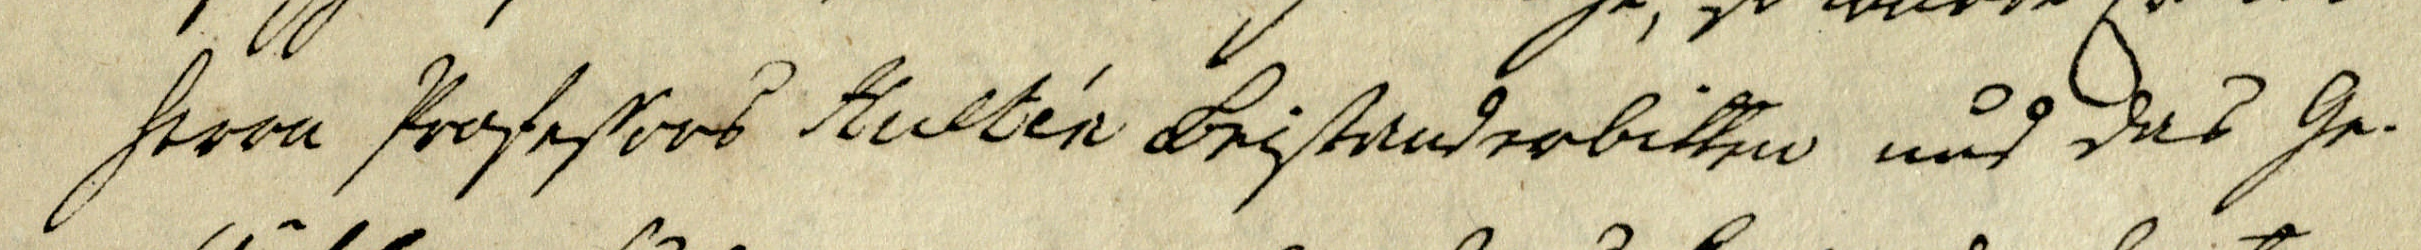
Herrn Professors Hultén Beistand erbitten und das Ge¬
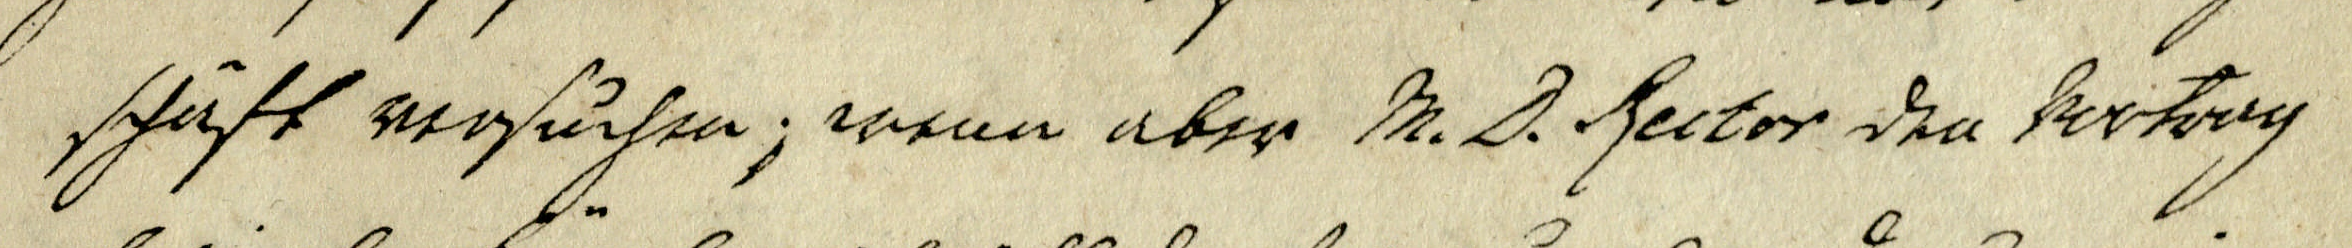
schäfte versuchen; wenn aber M. D. Rector den Vortrag
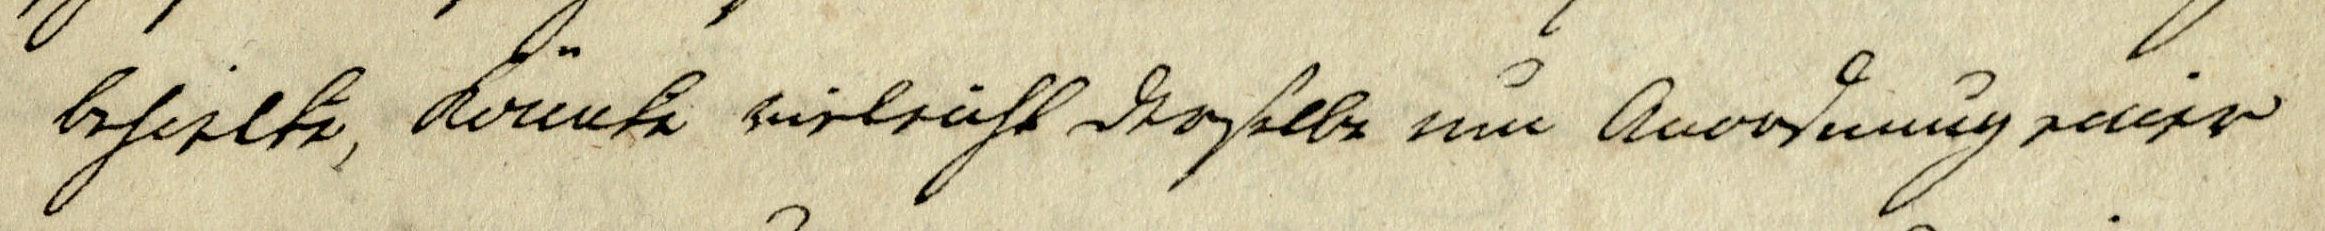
behielte, könnte vieleicht derselbe um Anordnung einer
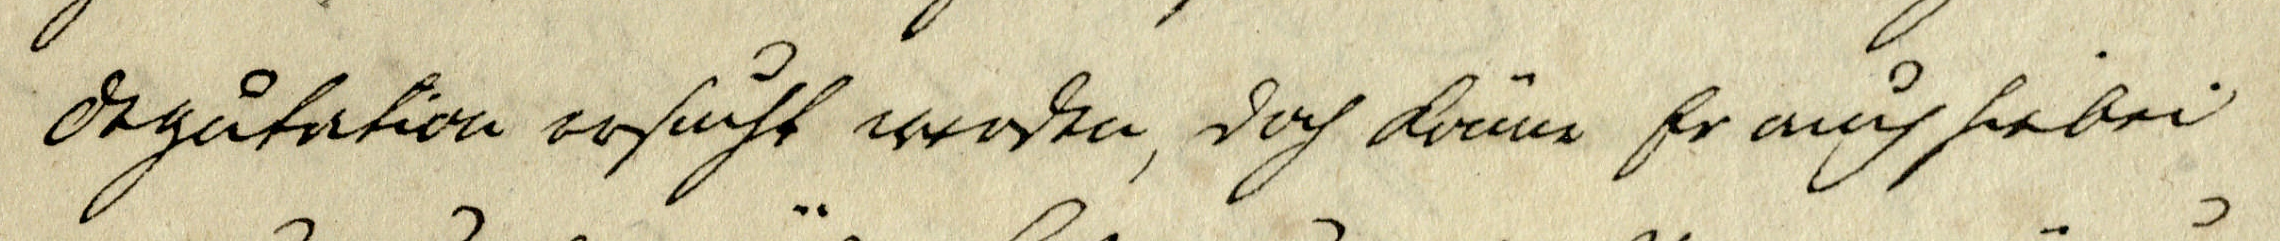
Deputation ersucht werden, doch könne Er auch hiebei
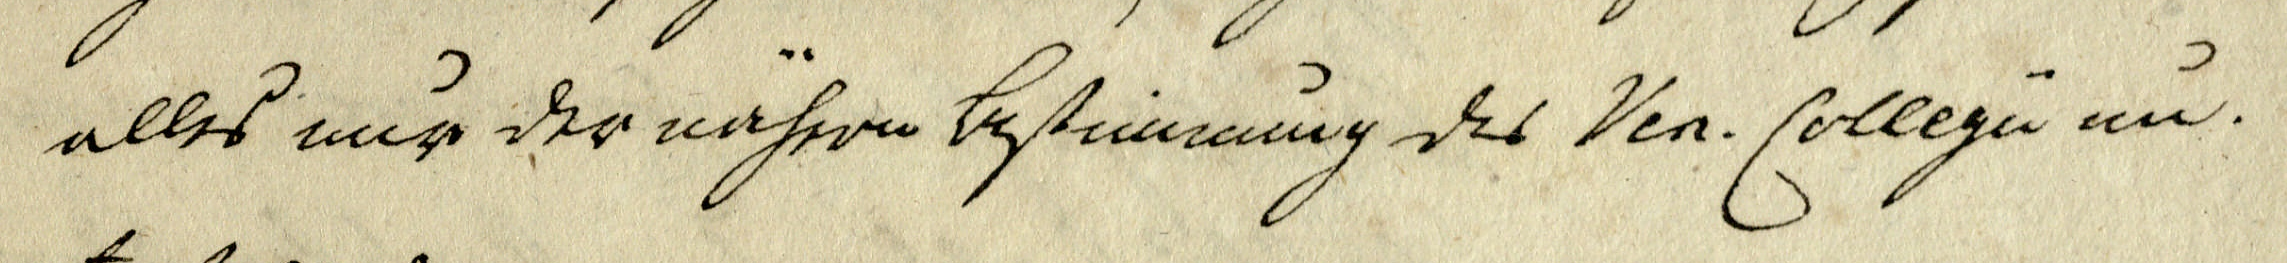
alles nur der nähern Bestimmung des Ven. Collegii un¬
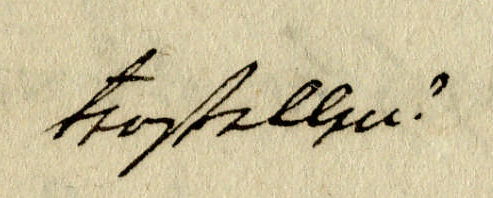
terstellen?
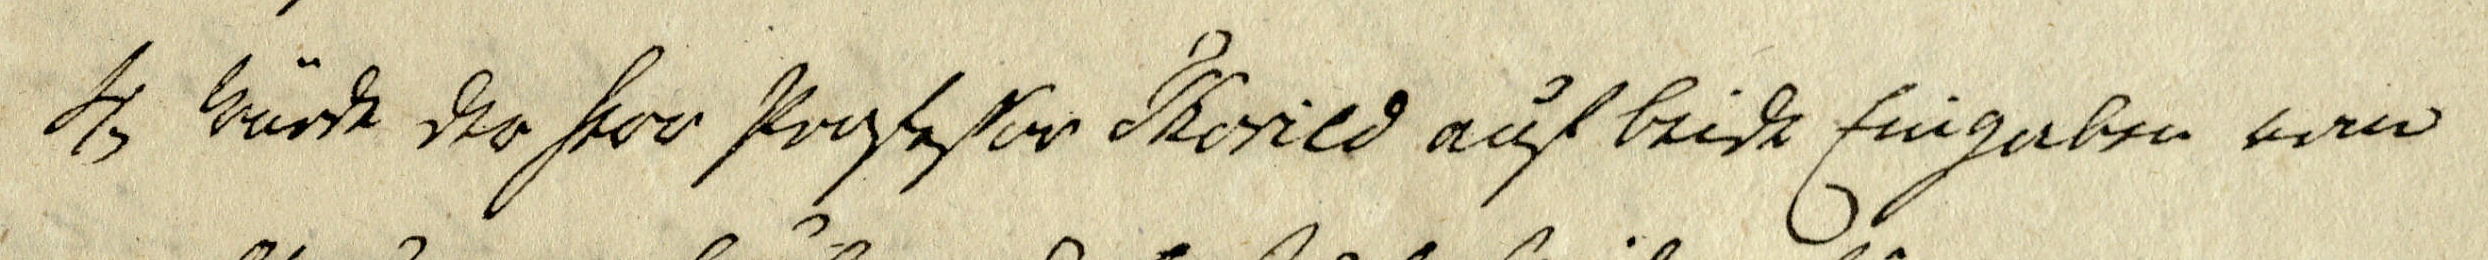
4. Würde der Herr Professor Thorild auf beide Eingaben vom
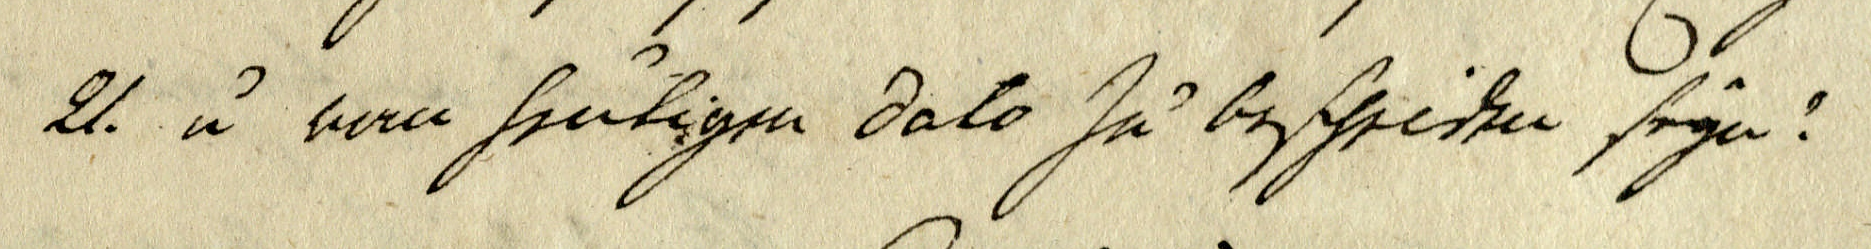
21. u vom heutigen dato zu bescheiden seÿn?
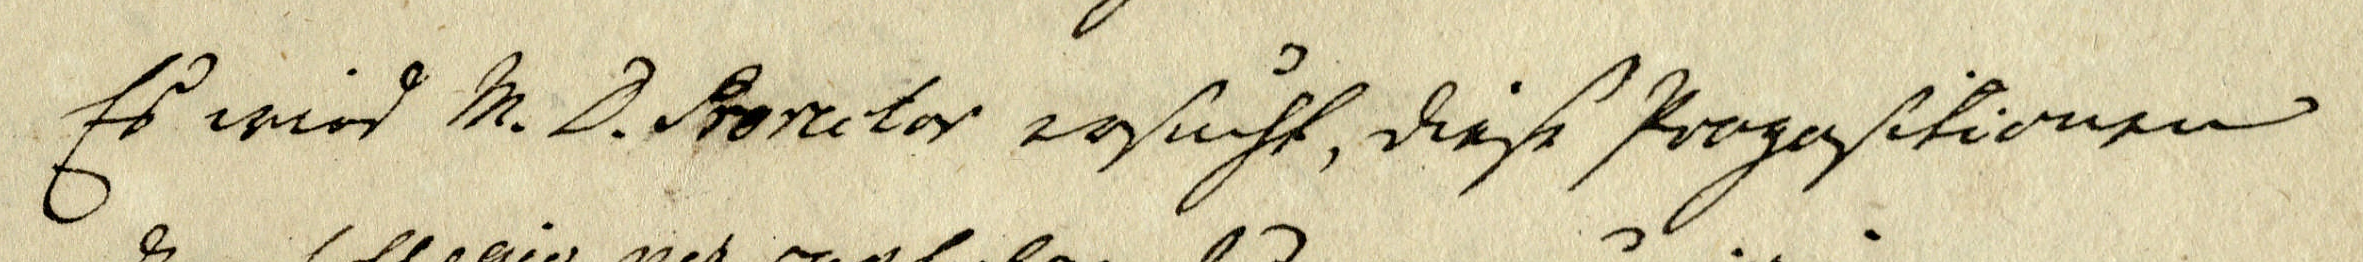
Es wird M. D. Prorector ersucht, diese Propositionen
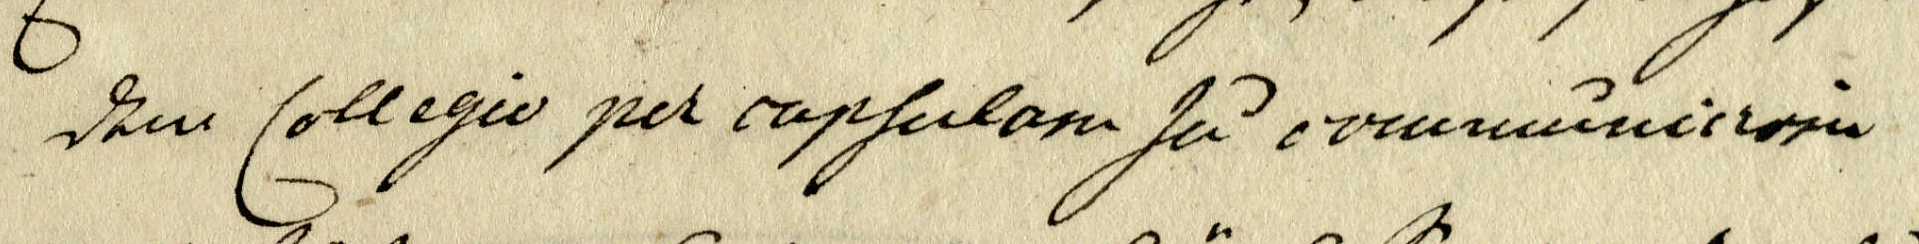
dem Collegio per capsulam zu communiciren
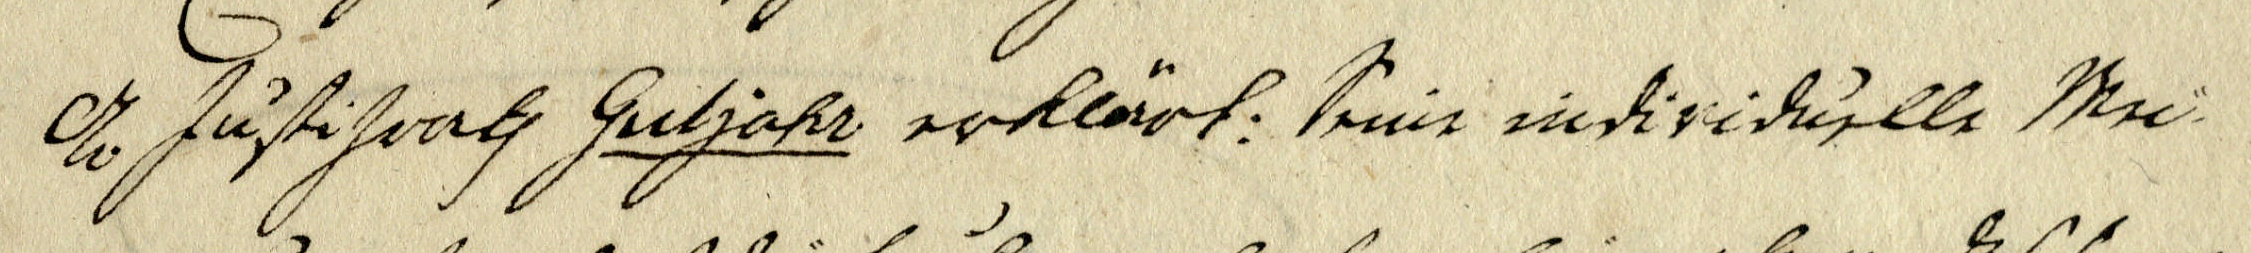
dh Justizrath Gutjahr erklärt: Seine individuelle Mei¬
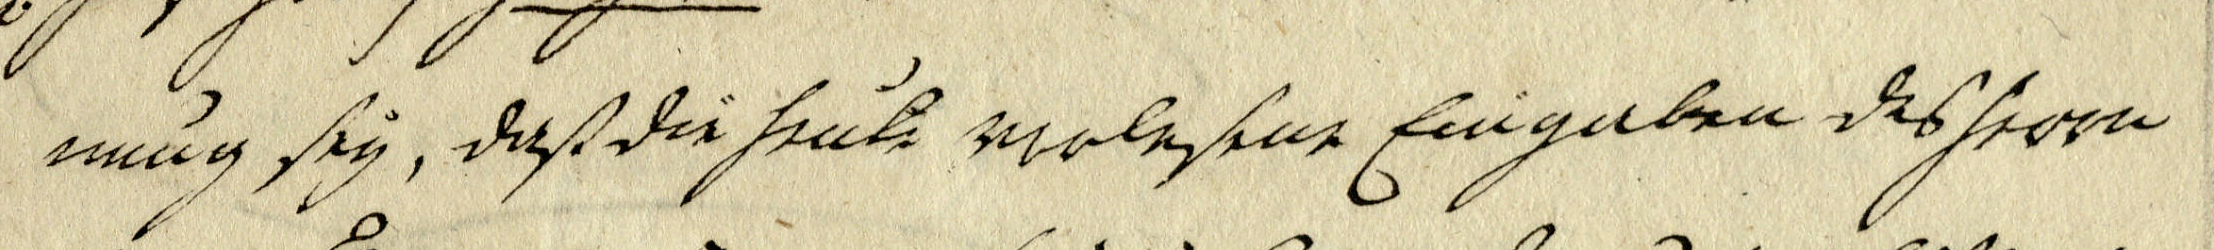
nung seÿ, daß die heute verlesene Eingaben des Herrn
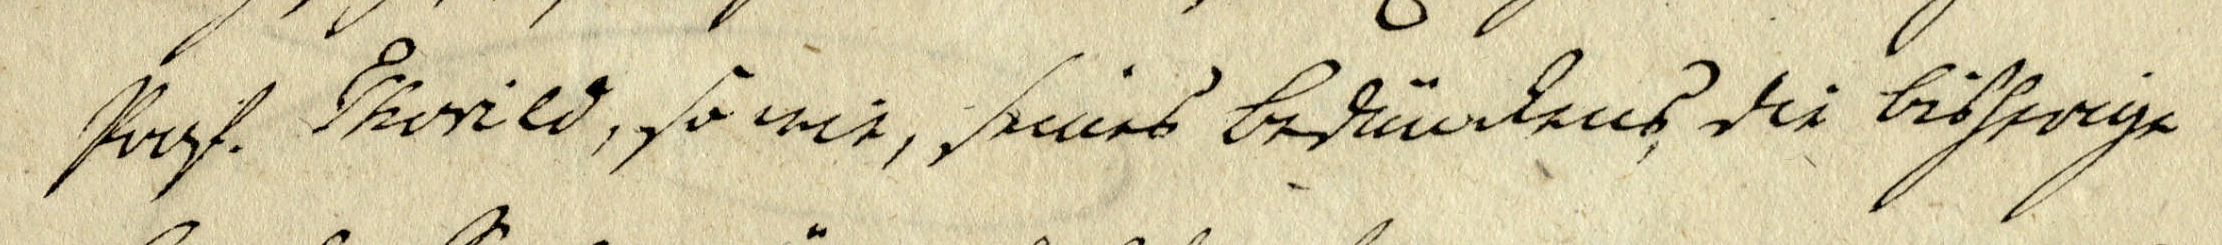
Prof. Thorild, so wie, seines Bedünckens, die bisherige
